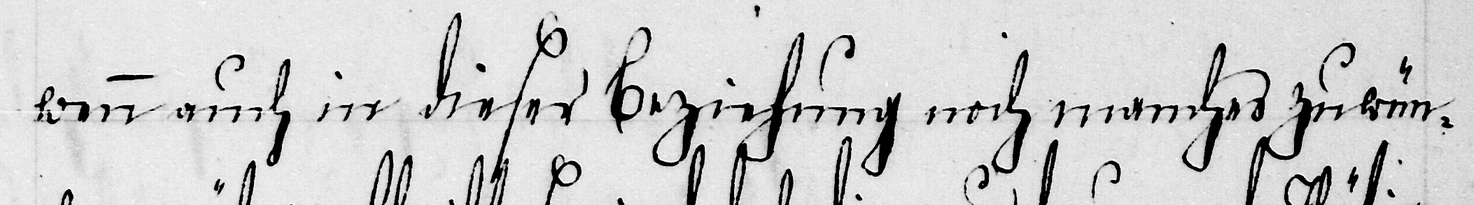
wenn auch in dieser Beziehung noch manches zu wün¬
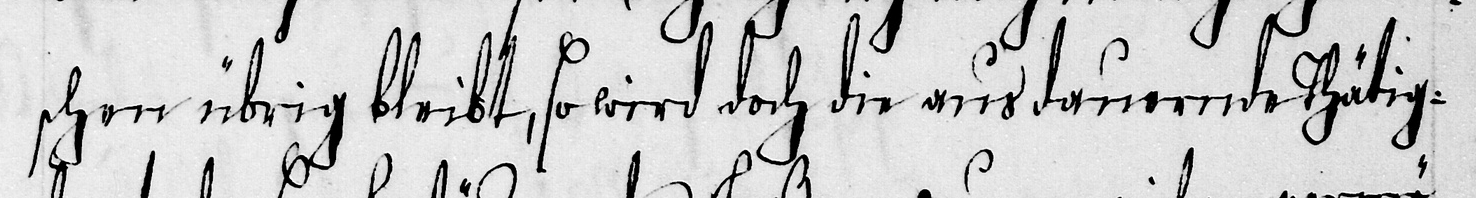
schen übrig bleibt, so wird doch die ausdauernde Thätig¬
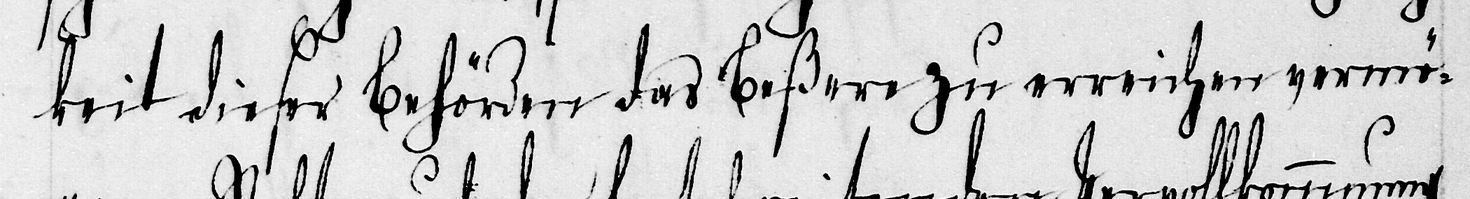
keit dieser Behörden das Beßere zu erreichen vermö¬
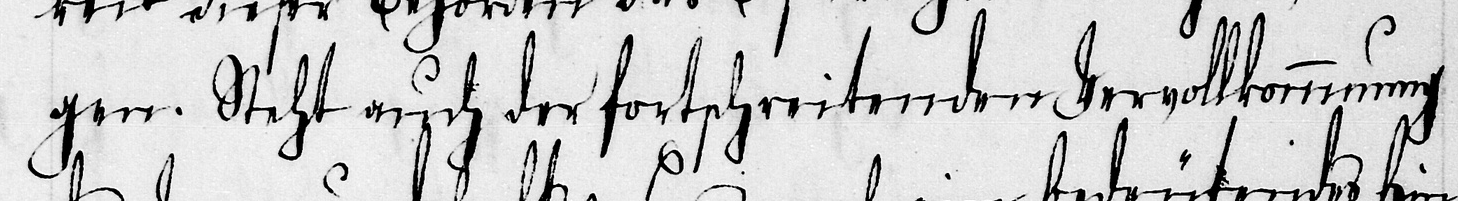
gen. Steht auch der fortschreitenden Vervollkommnung
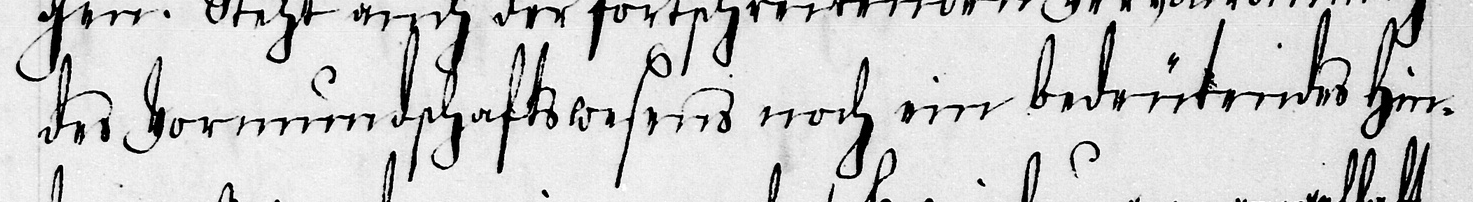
des Vormundschaftswesens noch ein bedeutendes Hin¬
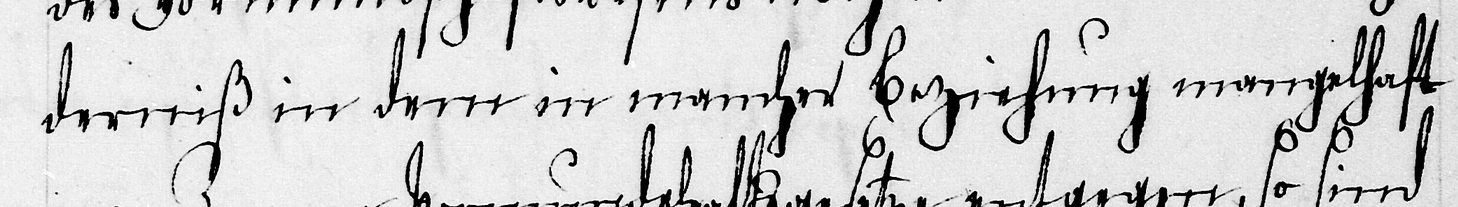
derniß in dem in mancher Beziehung mangelhaft
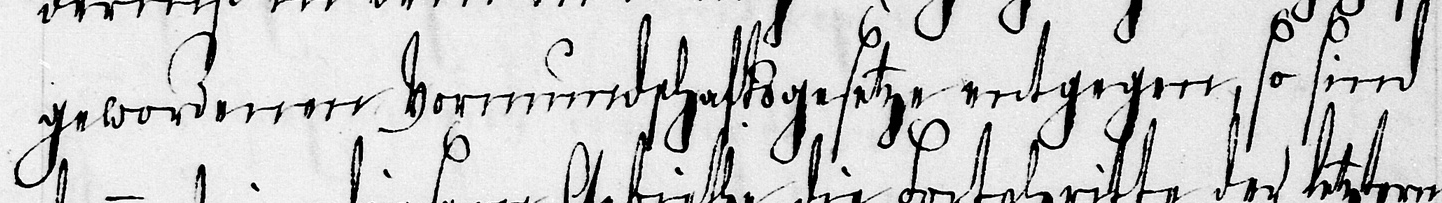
gewordenen Vormundschaftsgesetze entgegen, so sind
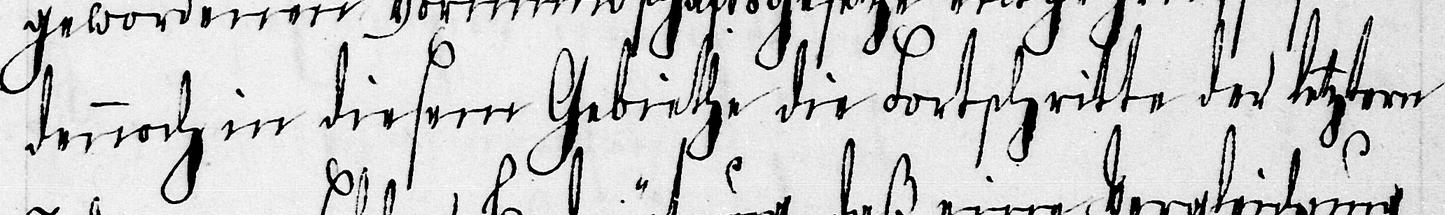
dennoch in diesem Gebiethe die Fortschritte der letztern
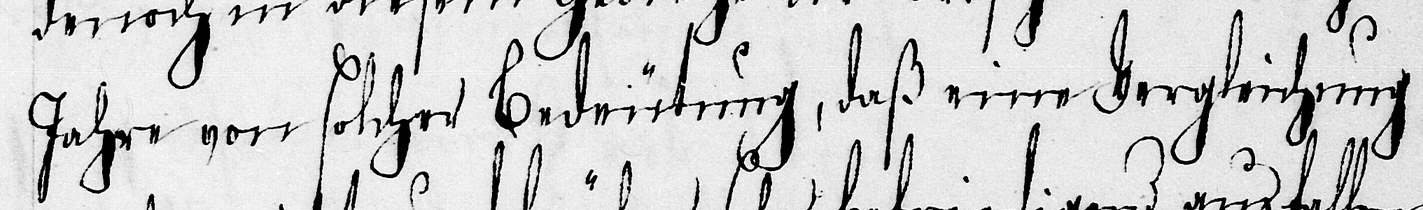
Jahre von solcher Bedeutung, daß eine Vergleichung
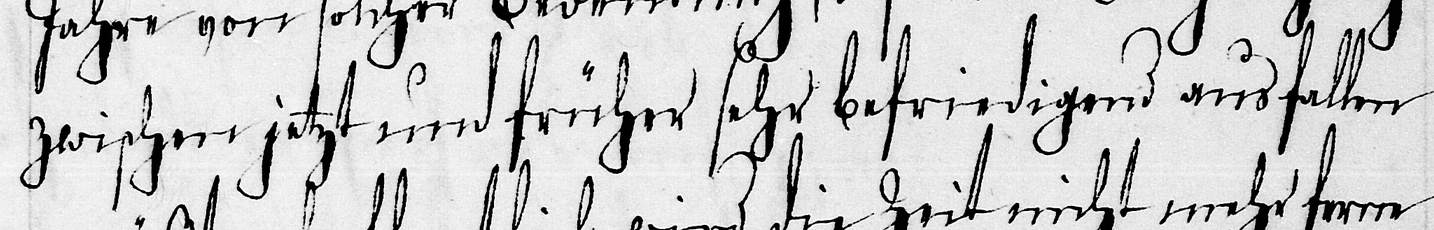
zwischen jetzt und früher sehr befriedigend ausfallen
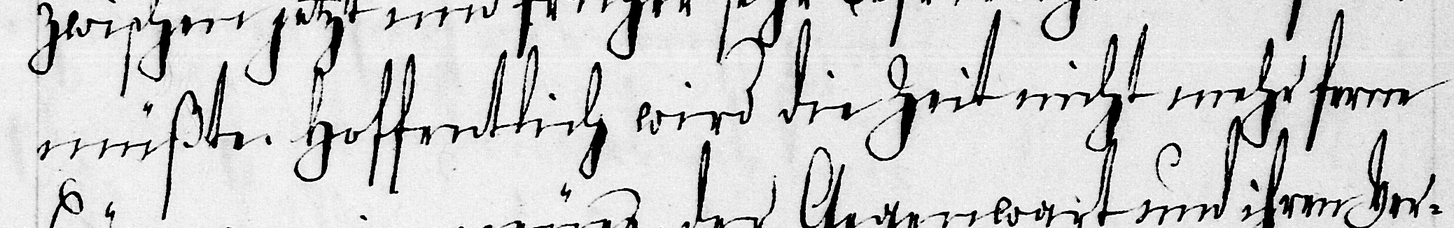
müßte. Hoffentlich wird die Zeit nicht mehr ferne
